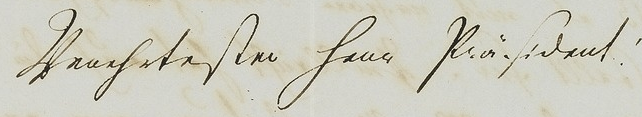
Verehrtester Herr Präsident!
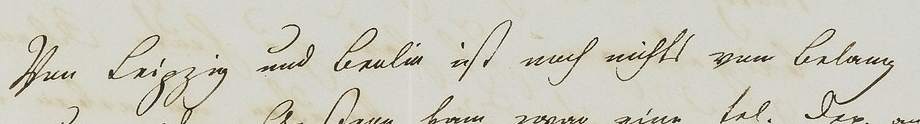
Von Leipzig und Berlin ist noch nichts von Belang
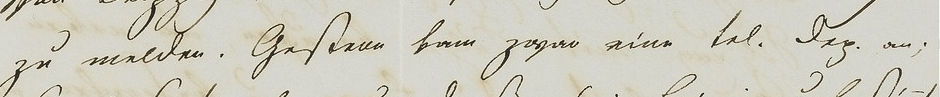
zu melden. Gestern kam zwar eine tel. Dep. an;
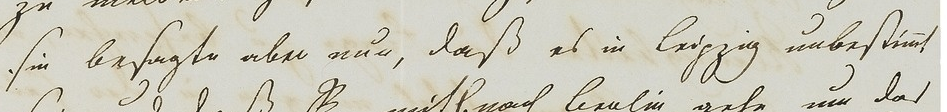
sie besagte aber nur, daß es in Leipzig unbestimmt
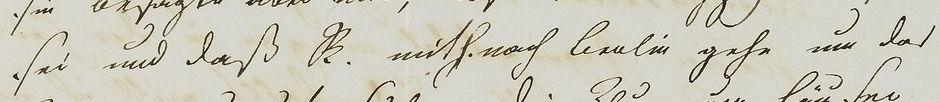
sei und daß R. mit H. nach Berlin gehe um das
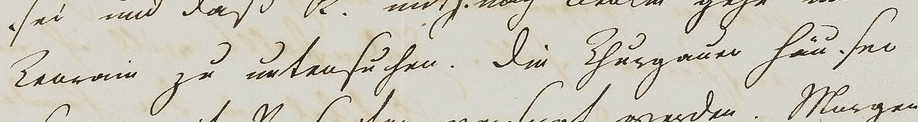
Terrain zu untersuchen. Die Thurgauer Häuser
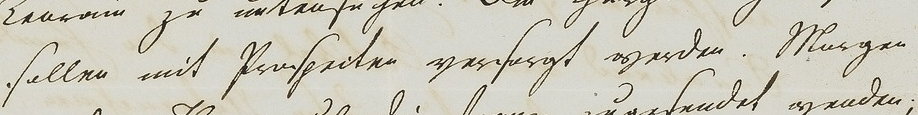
sollen mit Prospecten versorgt werden. Morgen
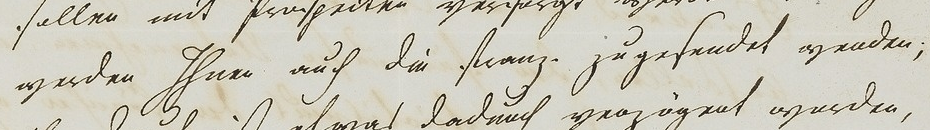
werden Ihnen auch die franz. zugesendet werden;
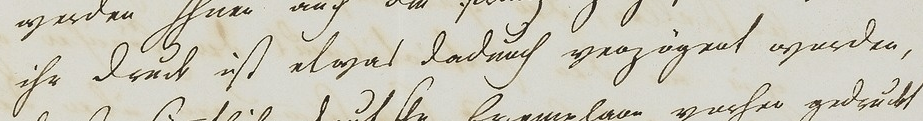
ihr Druck ist etwas dadurch verzögert worden,
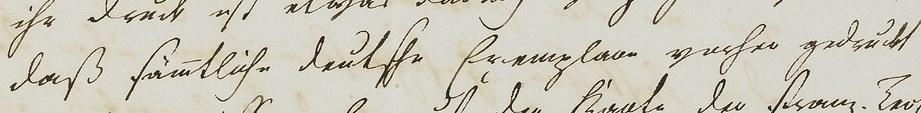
daß sämmtliche deutsche Exemplare vorher gedruckt
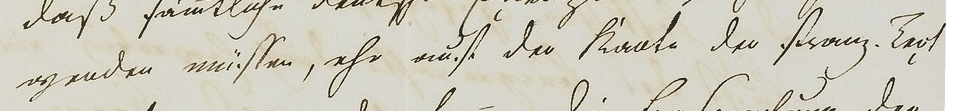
werden müssen, ehe auf der Karte der franz. Text
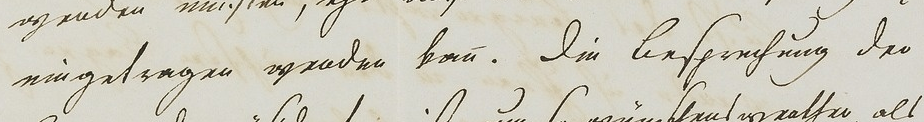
eingetragen werden kann. Die Besprechung der
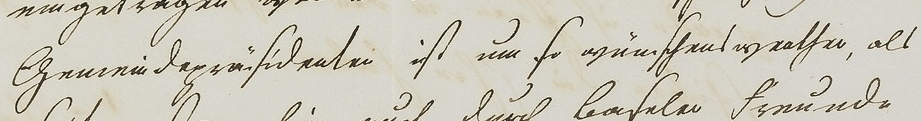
Gemeindepräsidenten ist um so wünschenswerther, als
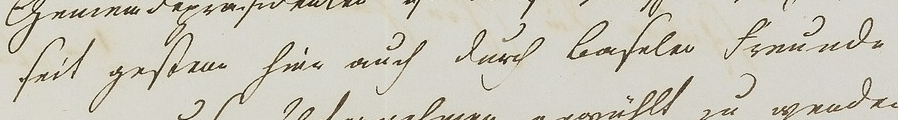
seit gestern hier auch durch Baseler Freunde
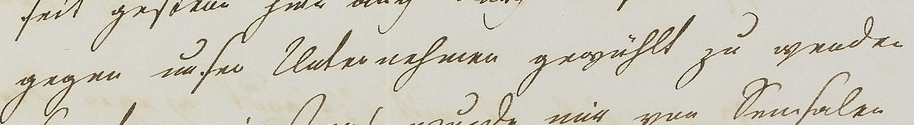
gegen unser Unternehmen gewühlt zu werden
